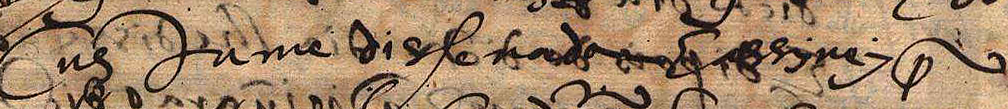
Custume disse nada e asyney p̄o
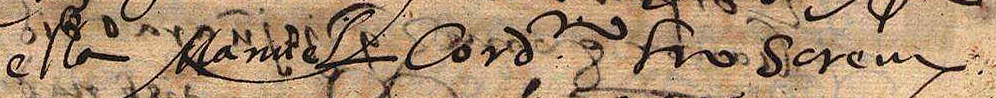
ella ManoeL Cord.ro ho screuy.
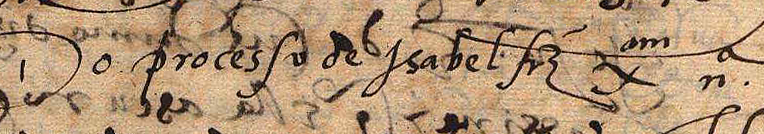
Do processo de jsabel frz̄ xam na
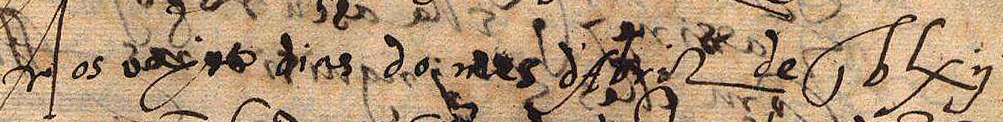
Aos oyto dias do mes dAbriL de j̄bLXij
